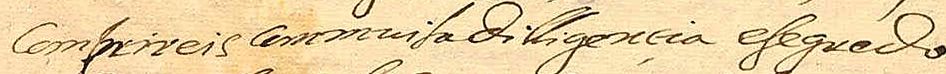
comprireis com muita dilligençia e segredo
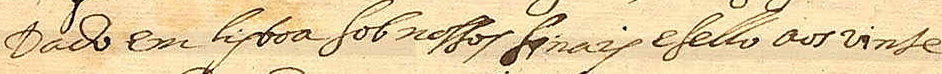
Dado Em lisboa sob nossos sinais E sello aos vinte
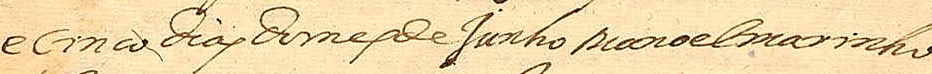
e çinco dias do mes de Junho manoel marinho
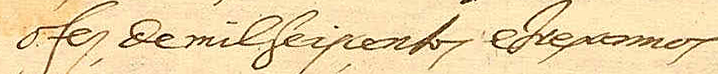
o fez de mil seisçentos e tres annos.
